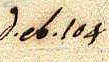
d. eb.104
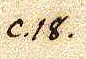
c.18.
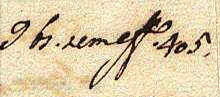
9 bs. sem eff.o 405.
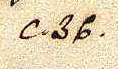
c.36.
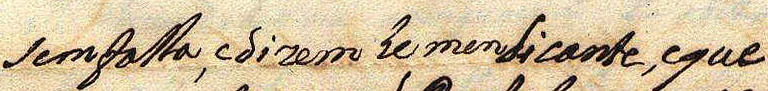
sem falta, e dizem he mendicante, e que
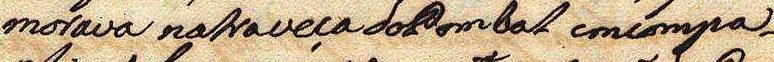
morava na traveça do Pombal em compa
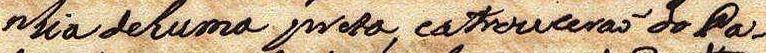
nhia de huma preta, e a trouceraõ do Pa
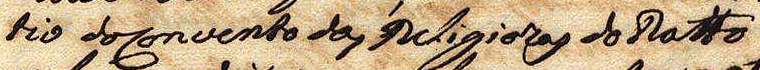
tio do Convento das Religiozas do Ratto
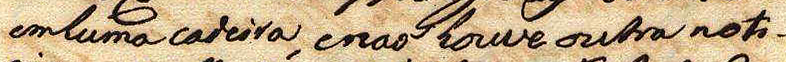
em huma cadeira, e naõ houve outra noti
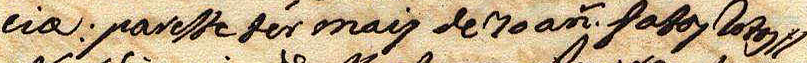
cia: paresse ter mais de 70 an̄. fatos Rotos //
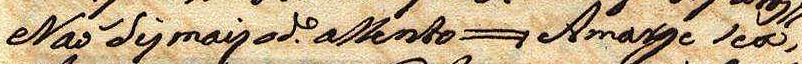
Naõ dis mais o d.o assento= A marge se a,
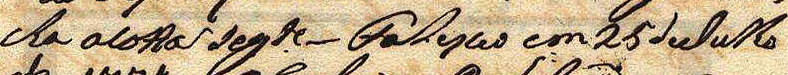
cha a cotta seg.te = Falesceo em 25 de Iulho
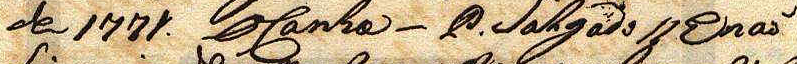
de 1771. O Canha = P. Salgado // E naõ
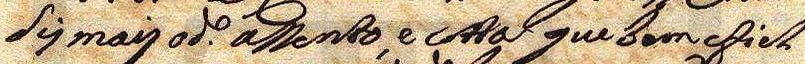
dis mais o d.o assento, e cotta que bem e fiel
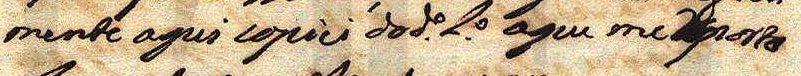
mente aqui copiei do d.o L.o a que me _porto
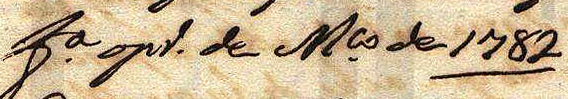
Lx.a o pr.o de M.co de 1782
